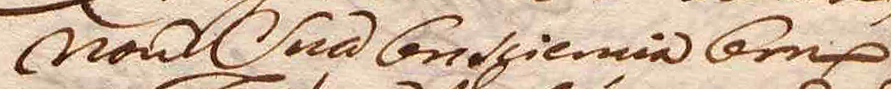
nou sua Consciençia Como
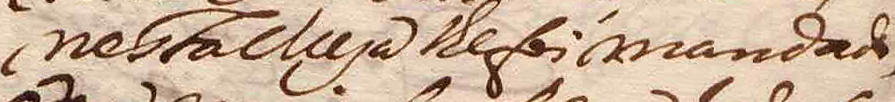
nesta Meza lhe foi mandado
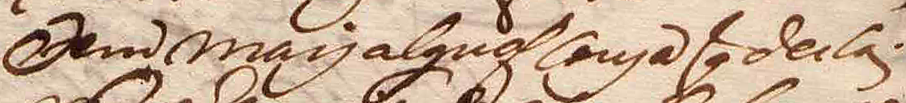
e tem mais alguā couza q̄ decla
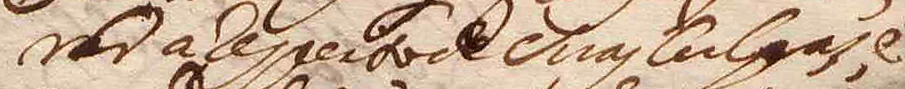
rar a Respeito de Suas Culpas, e
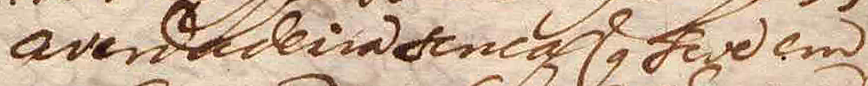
a verdadeira tençaõ q̄ teve em
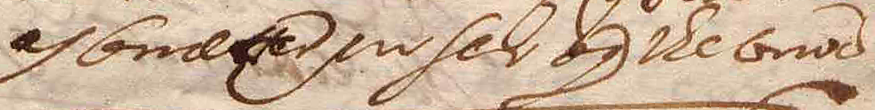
as cometer por ser o q̄ lhe convē
